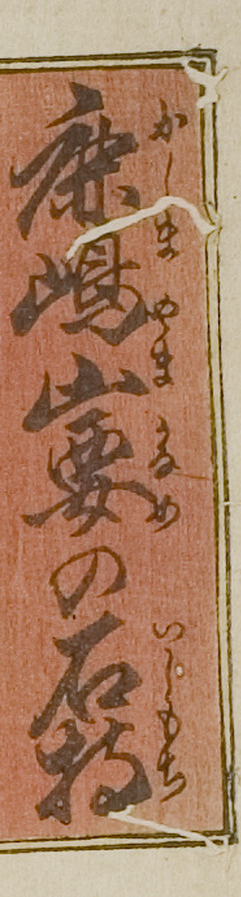鹿島山要の石持
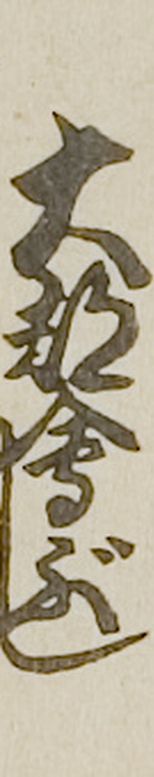大都会ぶし
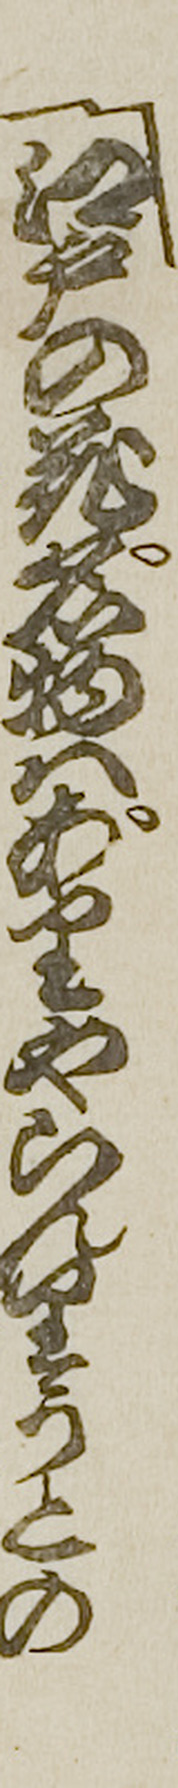〽江戸の花。名物は。ありやらんりうとの
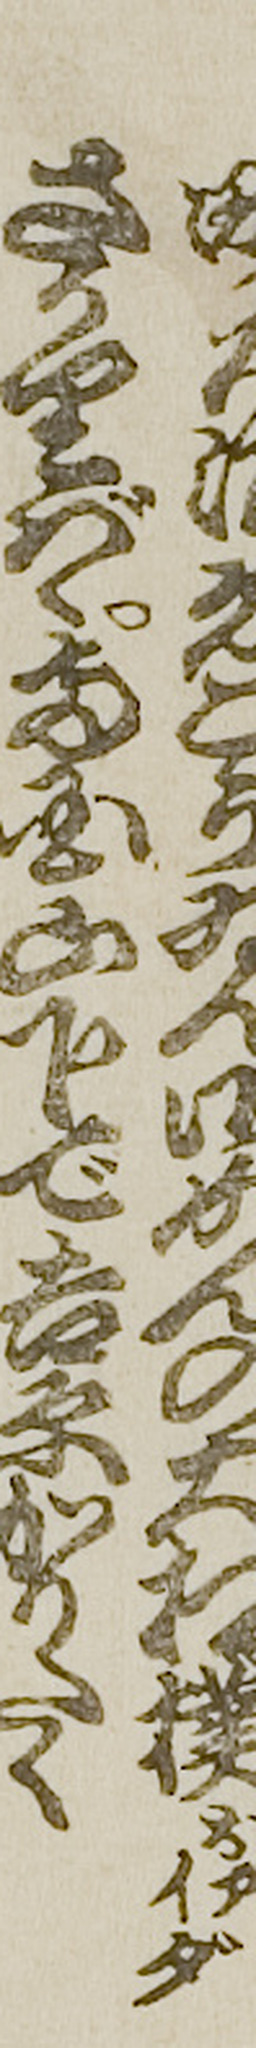さかりばゝ。両国山下で吉原かりたく
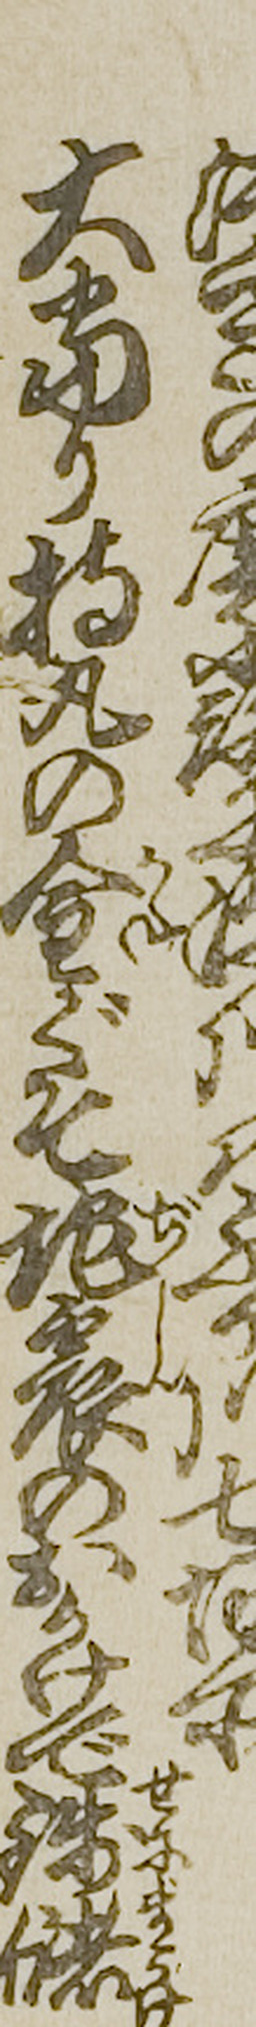大当り持丸の金ぐそ地震のおかけで銭儲
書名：鹿島山要の石持
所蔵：東京大学総合図書館 General Library in the University of Tokyo, JAPAN
